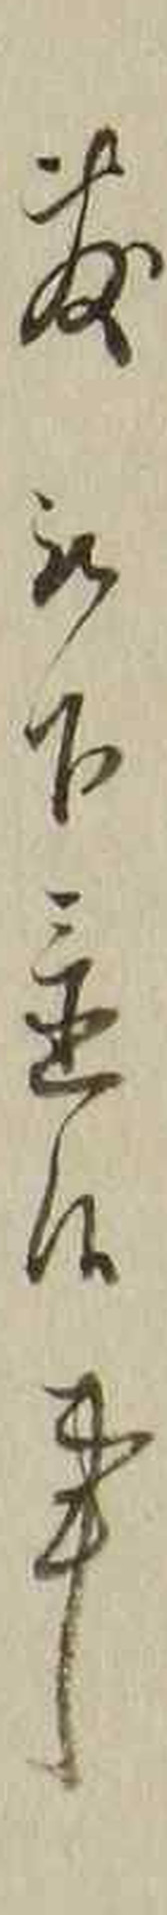敷被下置候事
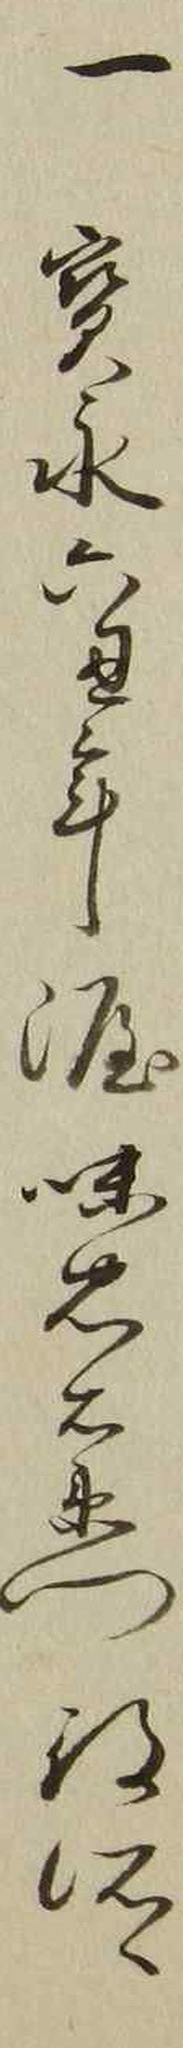一宝永六丑年渥味忠右衛門役所へ
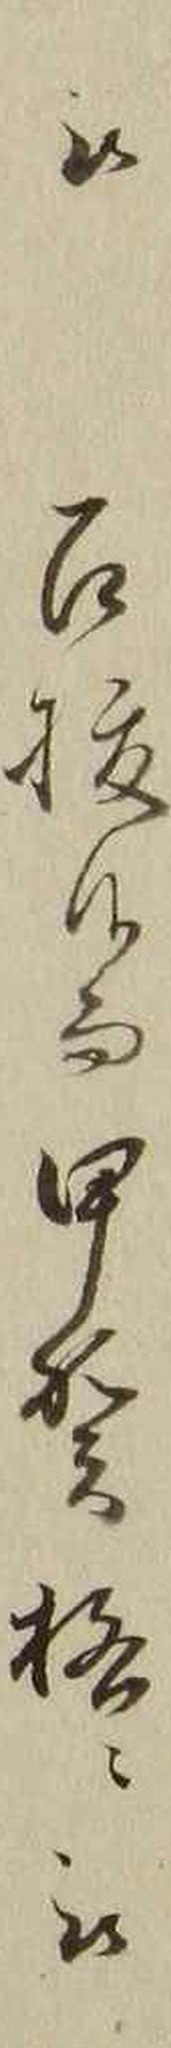被召抜候而甲警格ニ被
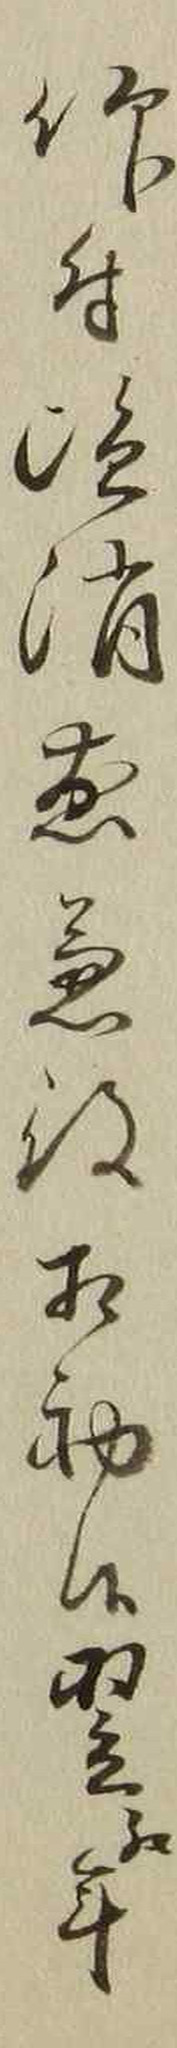仰付塩消煎兼役相勤候翌卯年
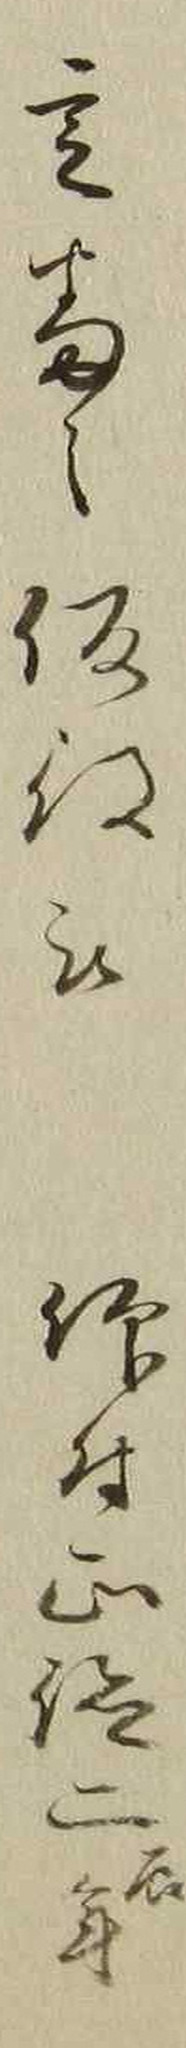定番之仮役被仰付正徳二辰年
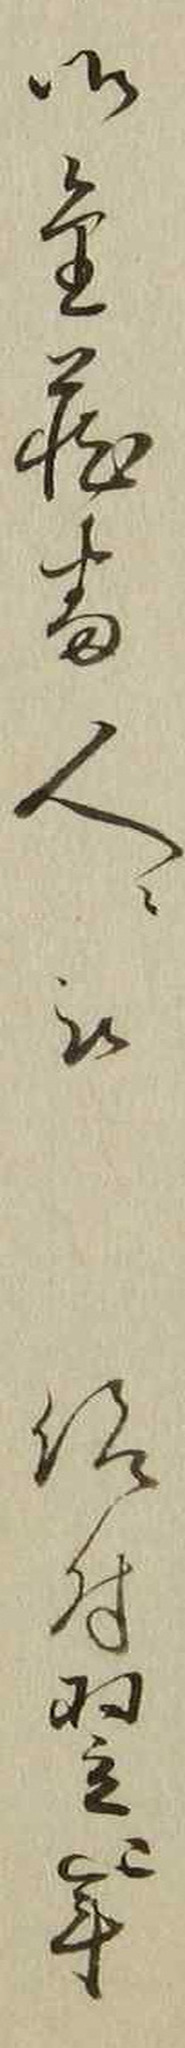御金蔵番人ニ被仰付翌巳年
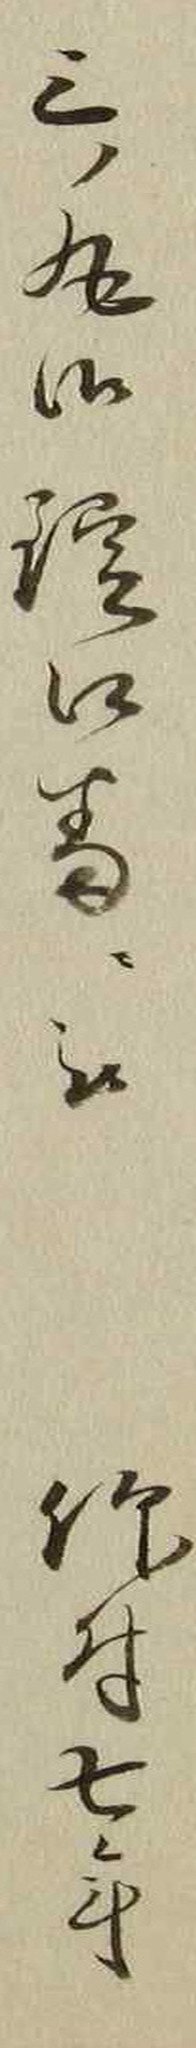三ノ丸御錠御口番ニ被仰付七年
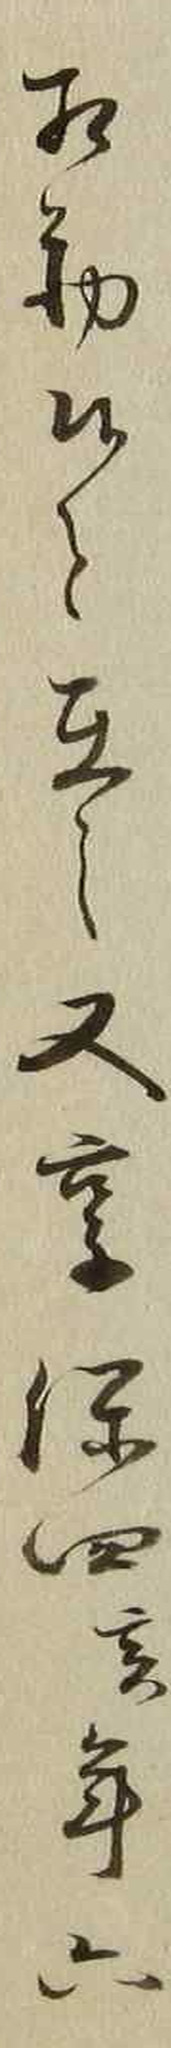相勤候と在之又享保四亥年六
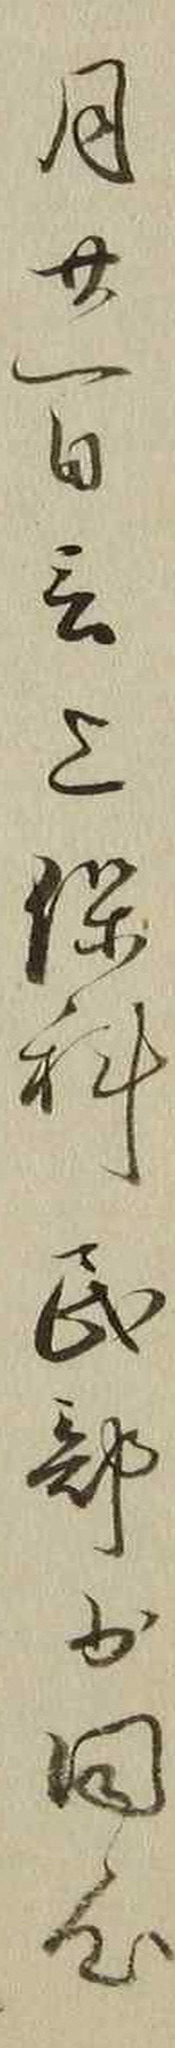月廿一日言上保科民部少同心
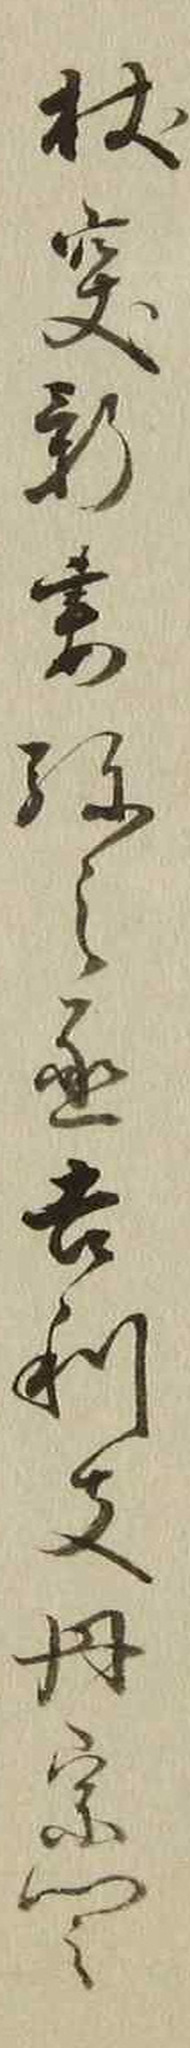杖突新妻弥之丞吉利支丹宗門之
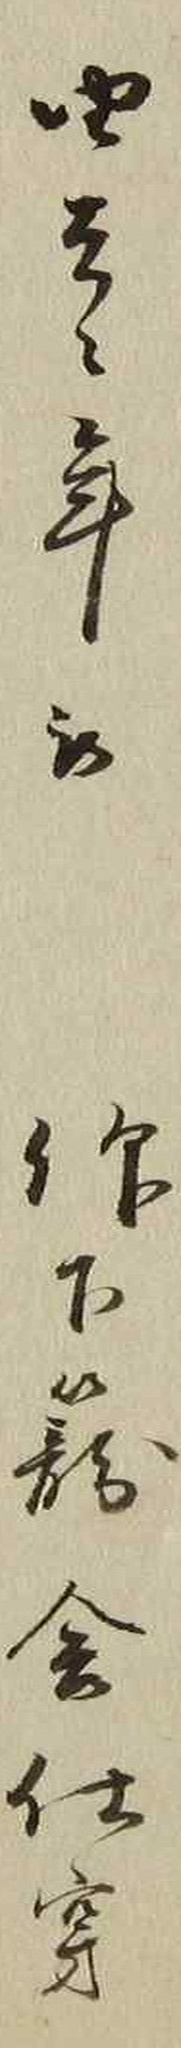由去々年被仰下篭舎仕穿
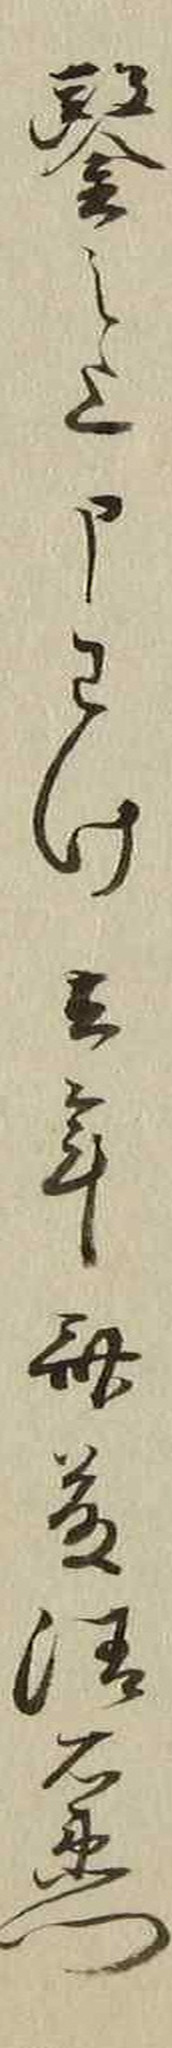鑿之上申わけ去年斎藤清右衛門
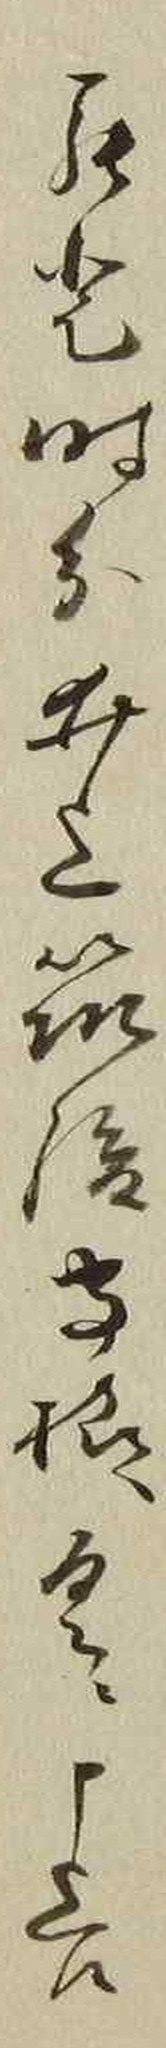罷登時分井上筑後守様へ具ニ申上候
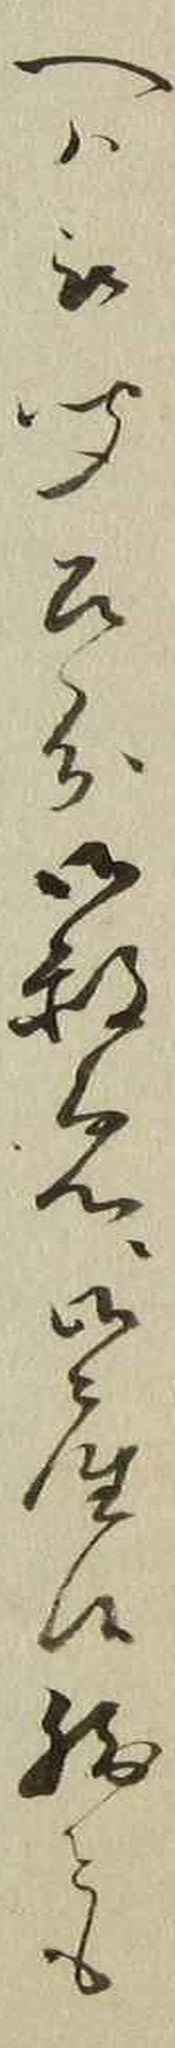へハ被聞召分御赦免ニ御座候然とも
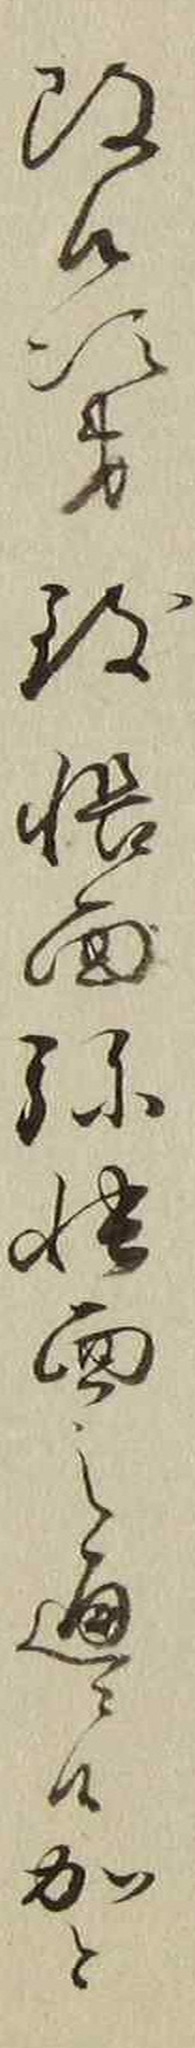改候次第致帳面弥帳面之通ニ候かと
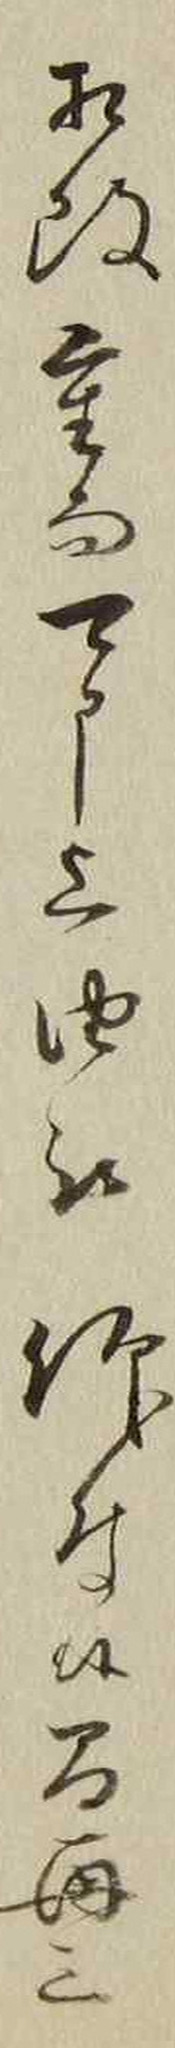相改重而可申上由被仰付候間再三
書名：諸士系譜　巻之52　に之部3
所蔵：会津若松市立会津図書館
